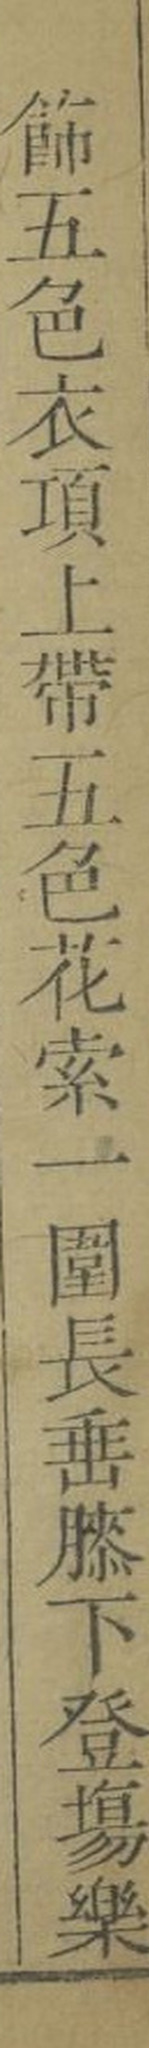飾五色衣項上帶五色花索一圍長垂膝下登塲樂
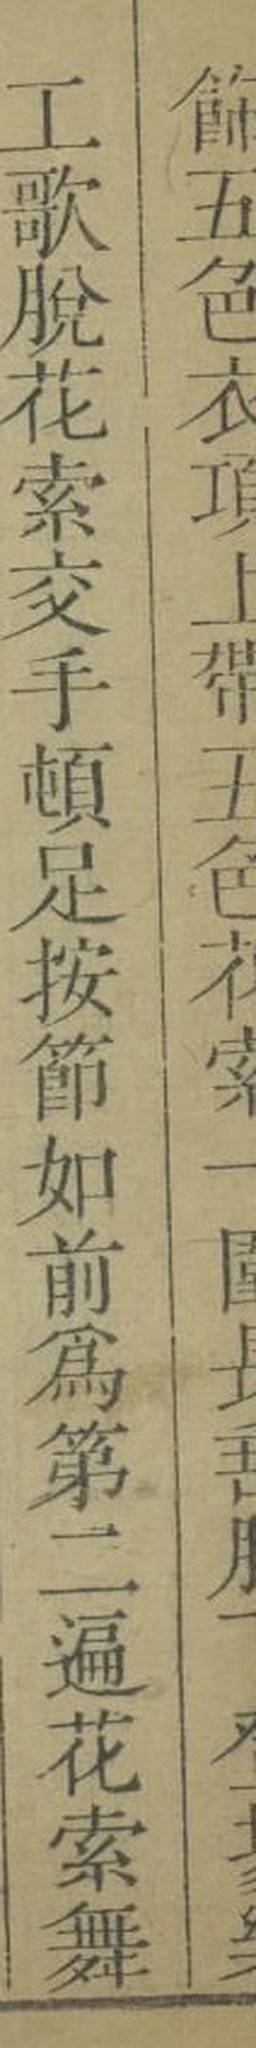工歌脱花索交手頓足按節如前爲第二遍花索舞
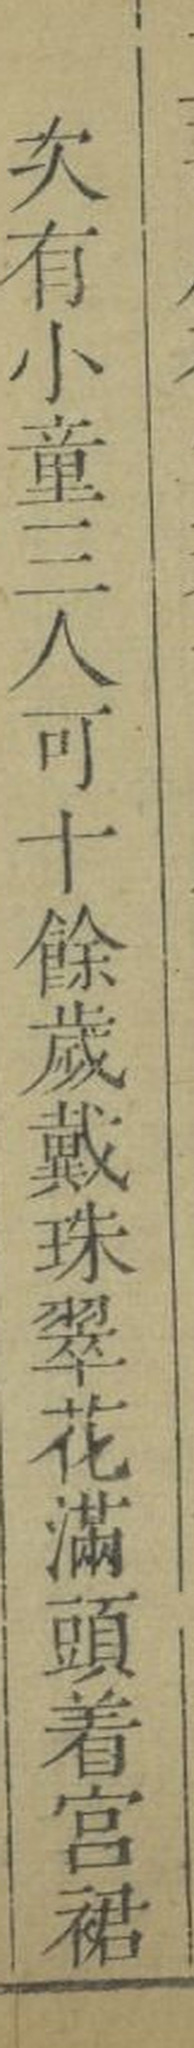次有小童三人可十餘歲戴珠翠花滿頭着宫裙
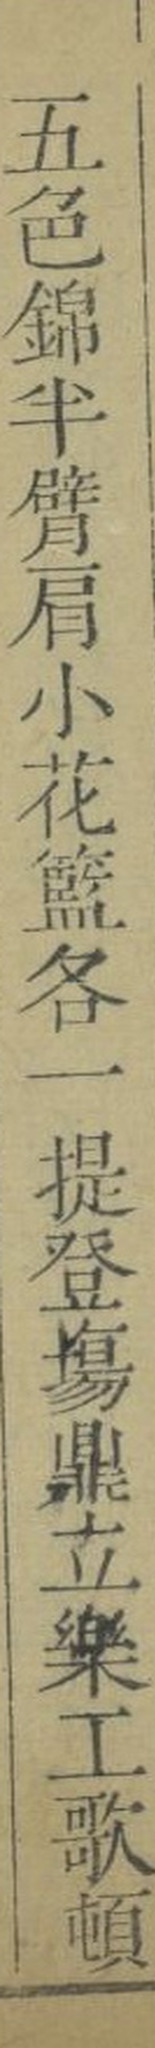五色錦半臂肩小花籃各一提登塲鼎立樂工歌頓
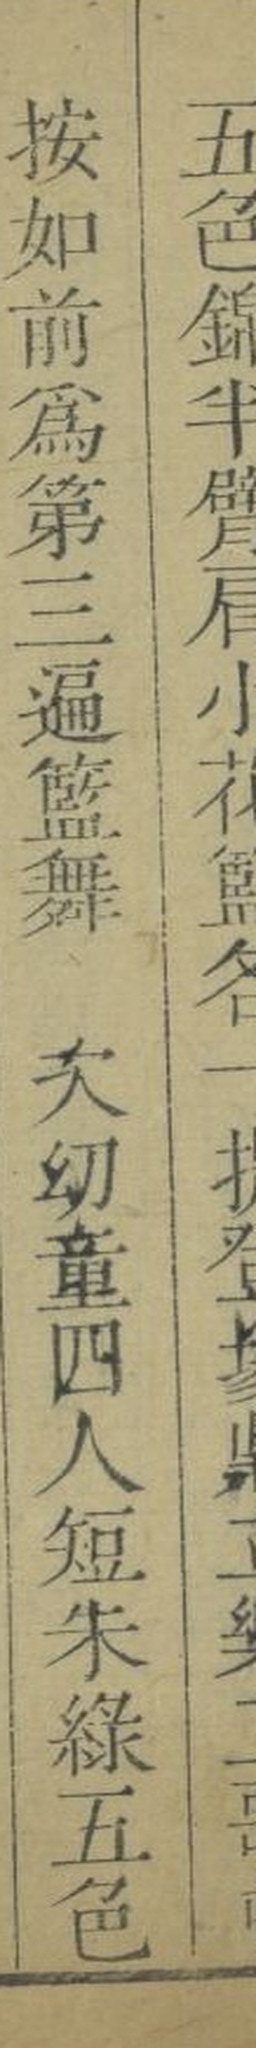按如前爲第三遍籃舞次幼童四人短朱綠五色
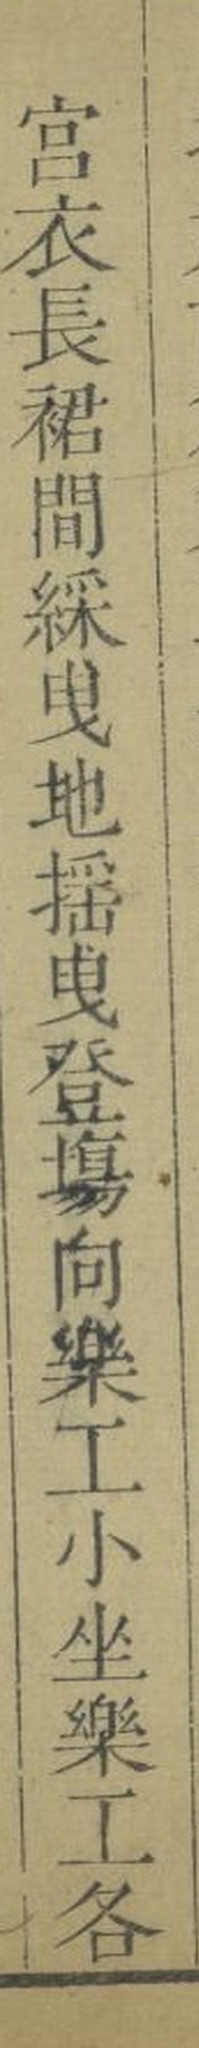宫衣長裙間綵拽地揺拽登塲向樂工小坐樂工各
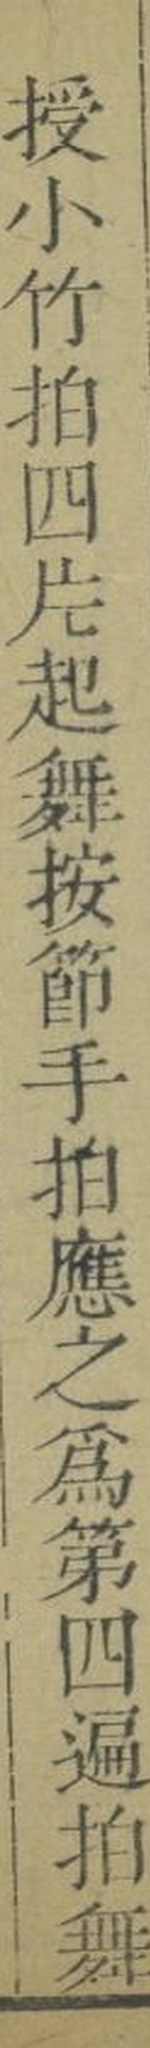授小竹拍四片起舞按節手拍應之爲第四遍拍舞
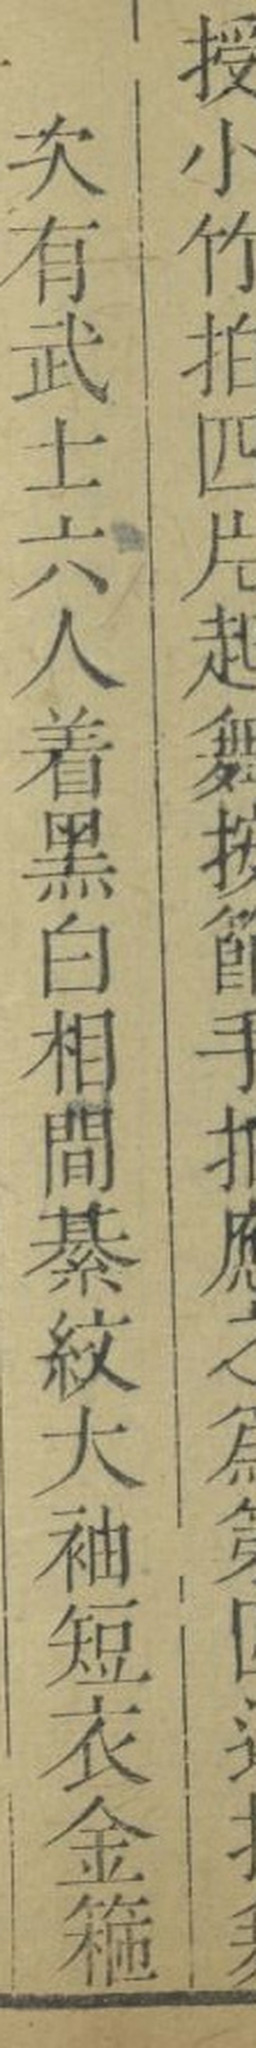次有武士六人着黑白相間綦紋大袖短衣金篐
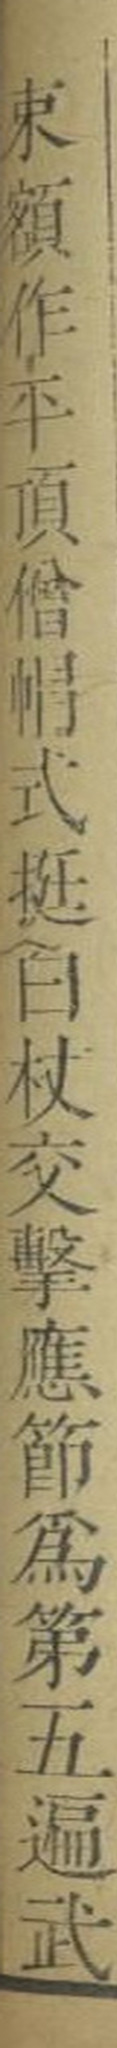束額作平頂僧帽式挺白杖交擊應節爲第五遍武
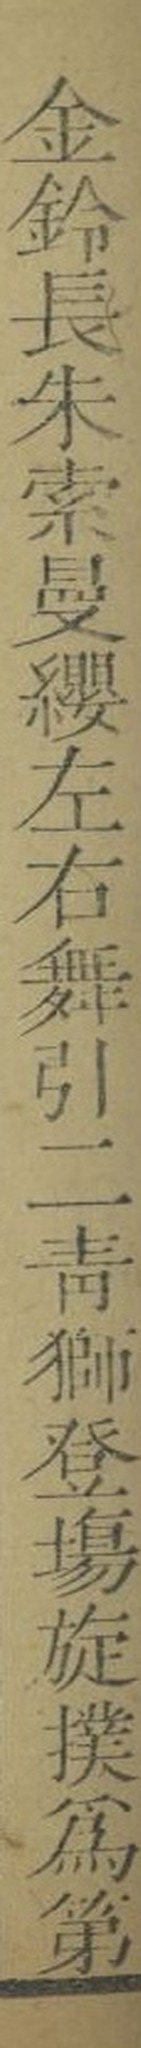金鈴長朱索曼纓左右舞引二靑獅登塲旋撲爲第
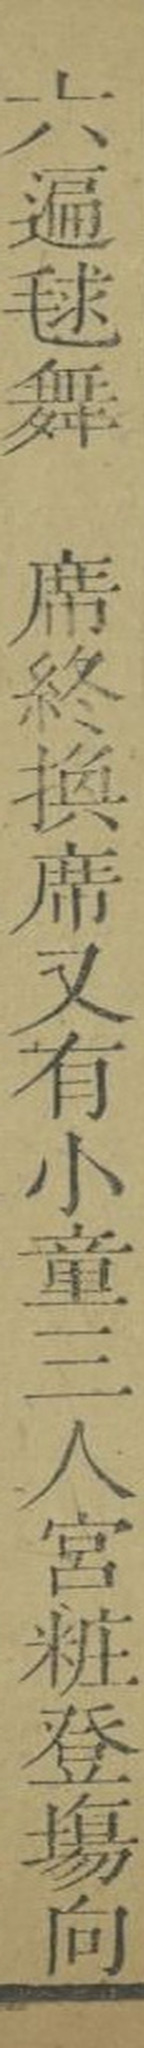六遍毬舞席終換席又有小童三人宮粧登塲向
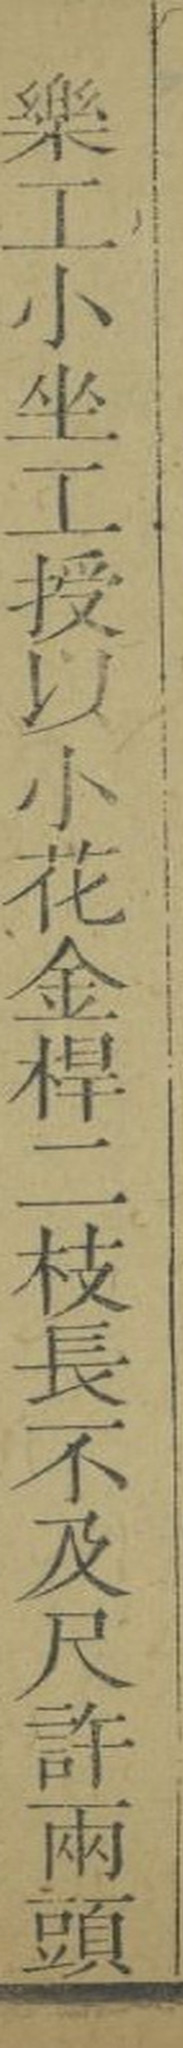樂工小坐工授以小花金桿二枝長不及尺許兩頭
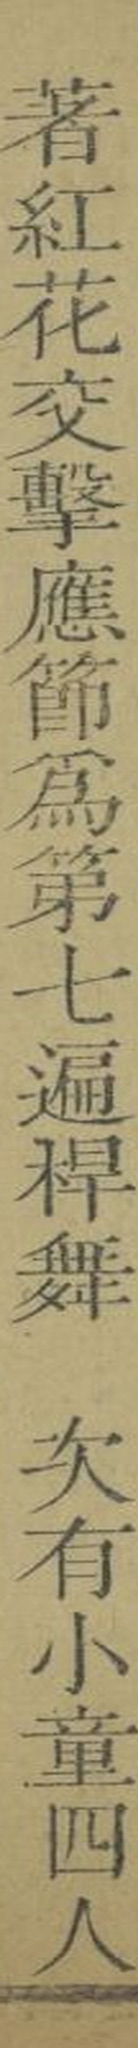著紅花交擊應節爲第七遍桿舞次有小童四人
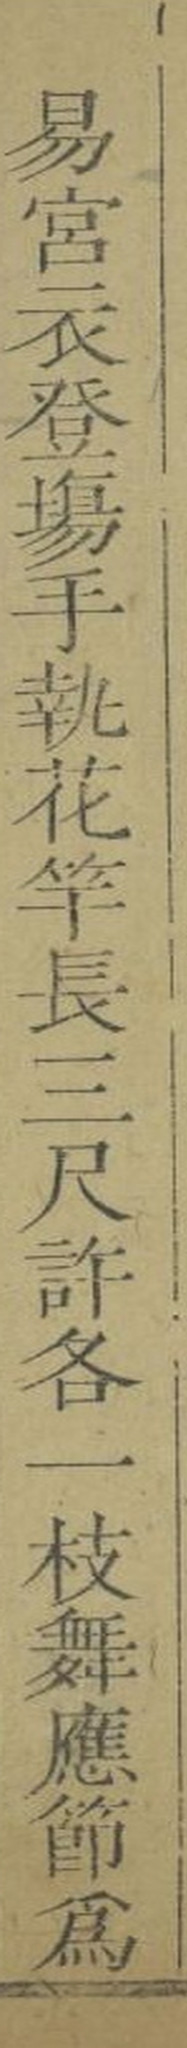易宮衣登塲手執花竿長三尺許各一枝舞應節爲
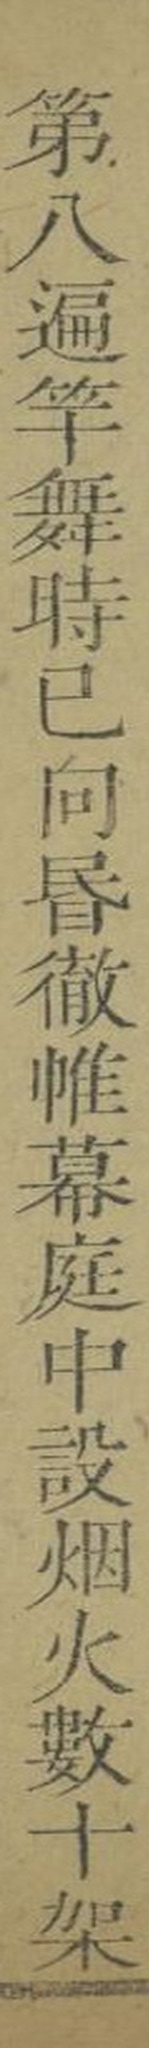第八遍竿舞時巳向昬徹帷幕庭中設烟火數十架
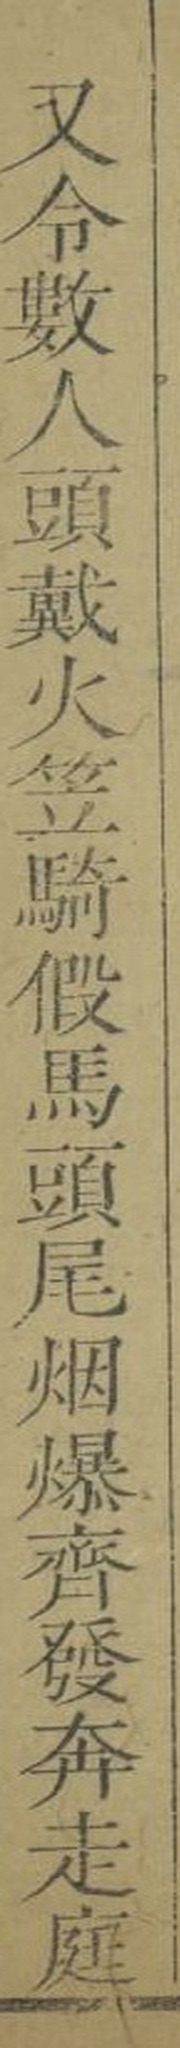又令數人頭戴火笠騎假馬頭尾烟爆齊發奔走庭
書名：中山伝信録 巻二
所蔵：University of the Ryukyus Library
